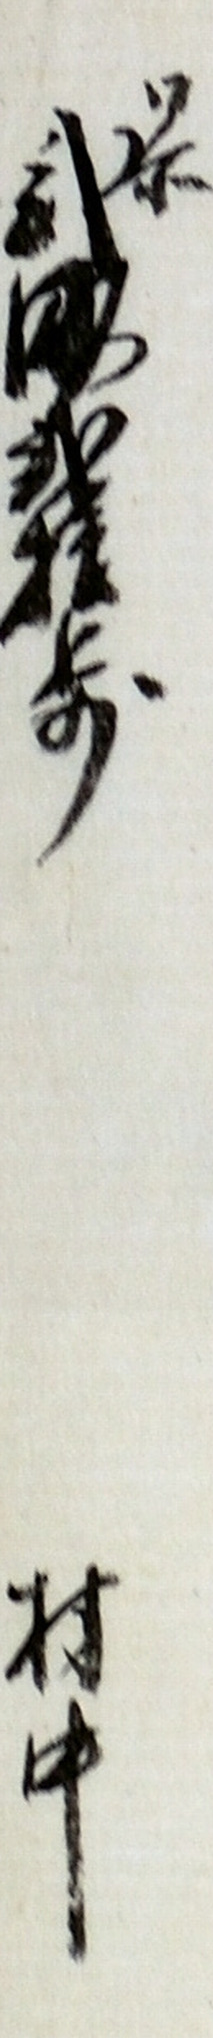弐畝弐拾歩村中
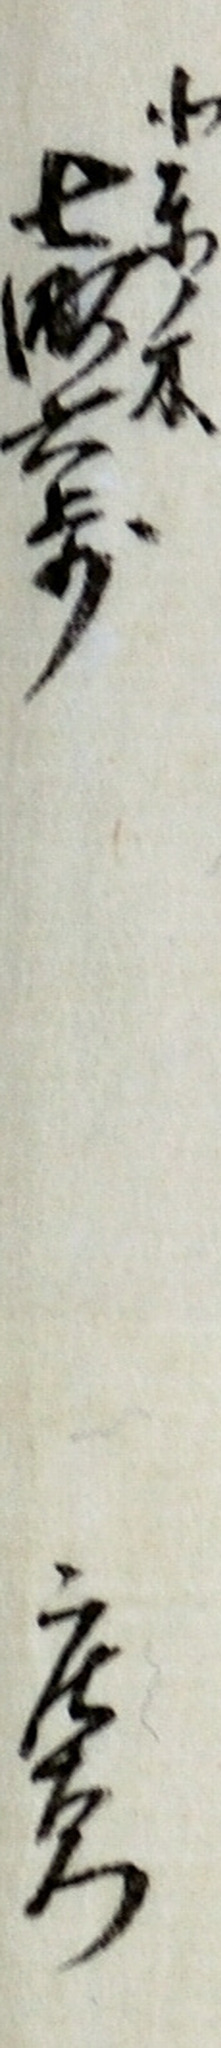七畝六歩庄右衛門
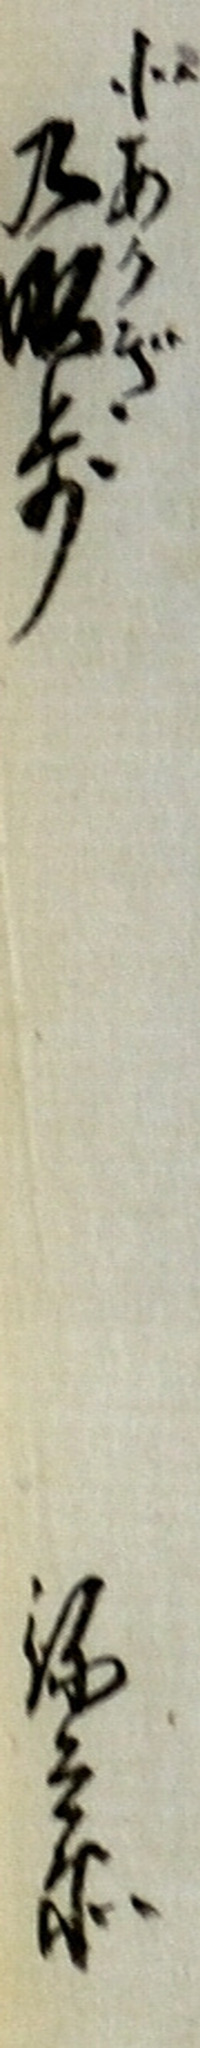九畝歩弥兵衛
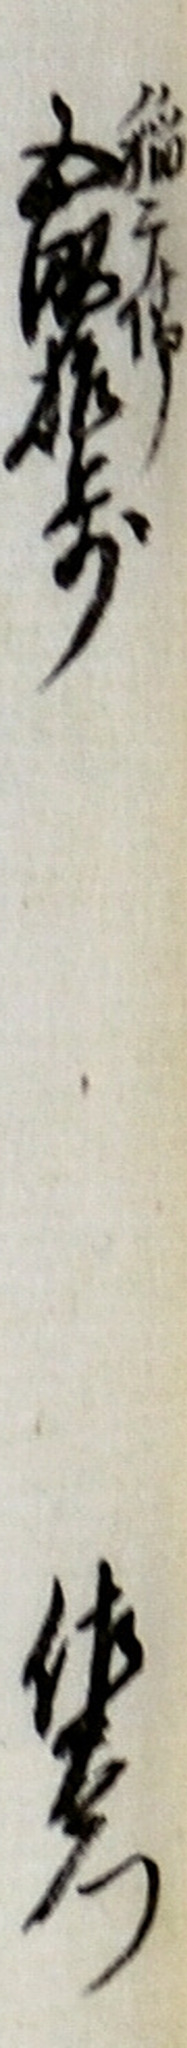五畝拾歩佐右衛門
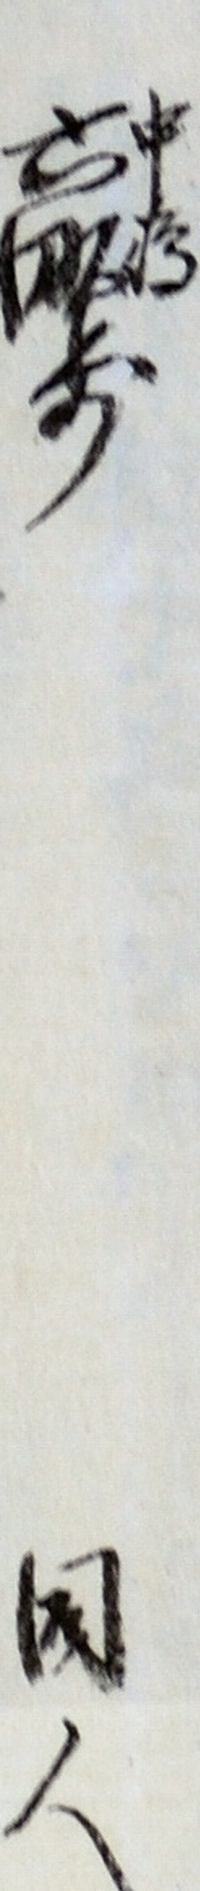六畝歩同人
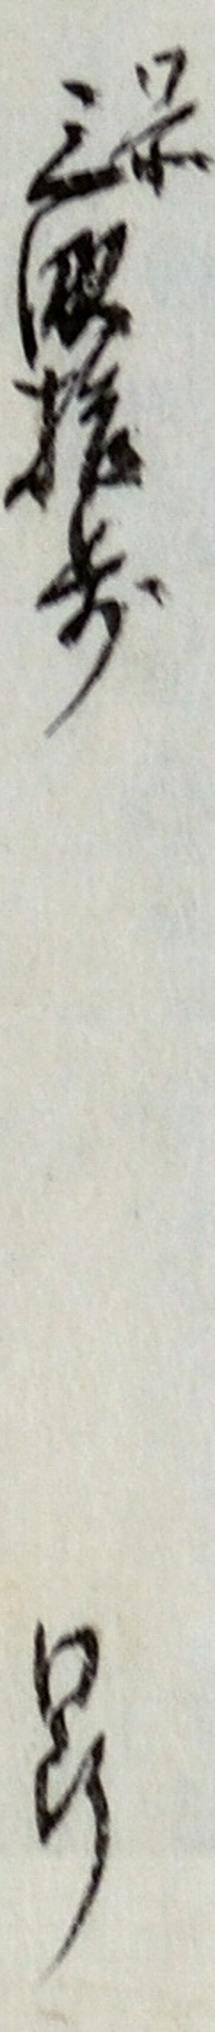三畝拾歩同断
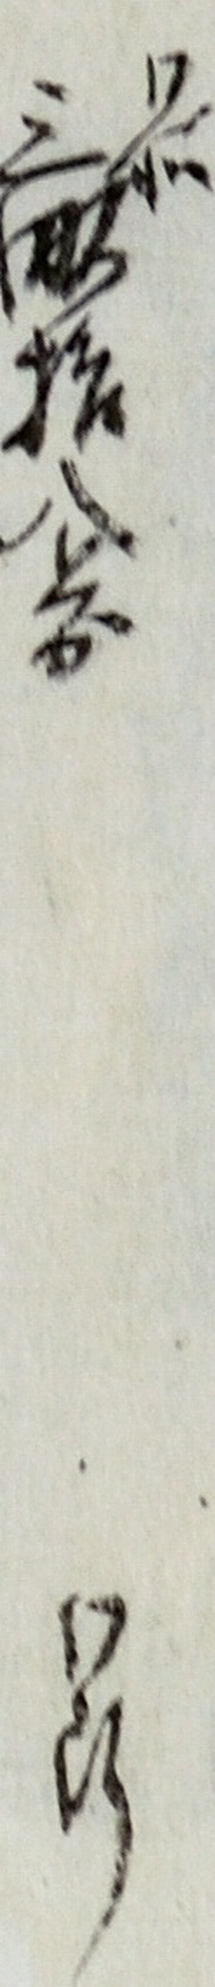三畝拾八歩同断
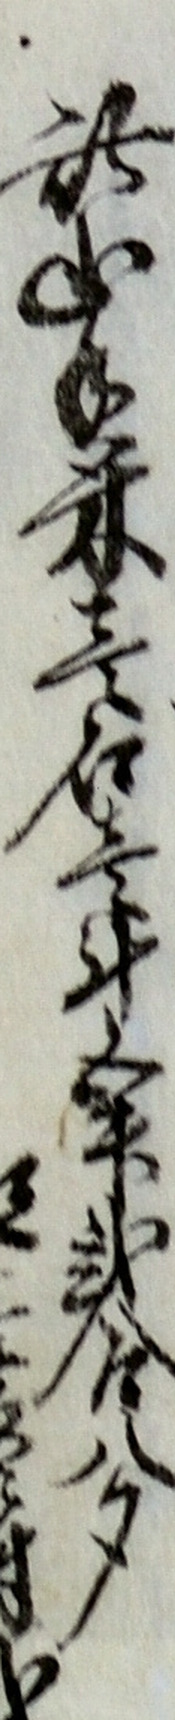此山手米壱石壱斗五升弐合八勺
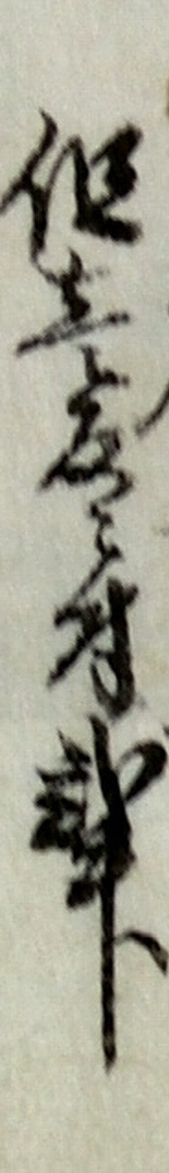但壱反ニ付弐升

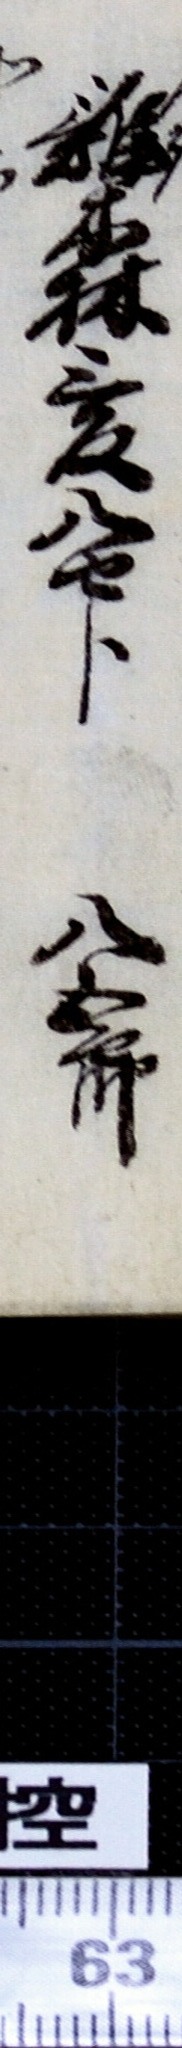雑木林三反八セ歩八五郎
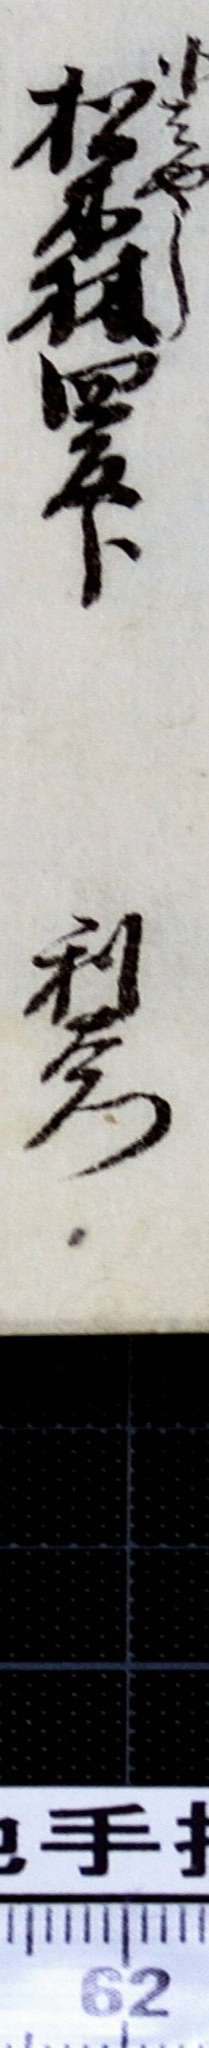松木林四反歩利右衛門
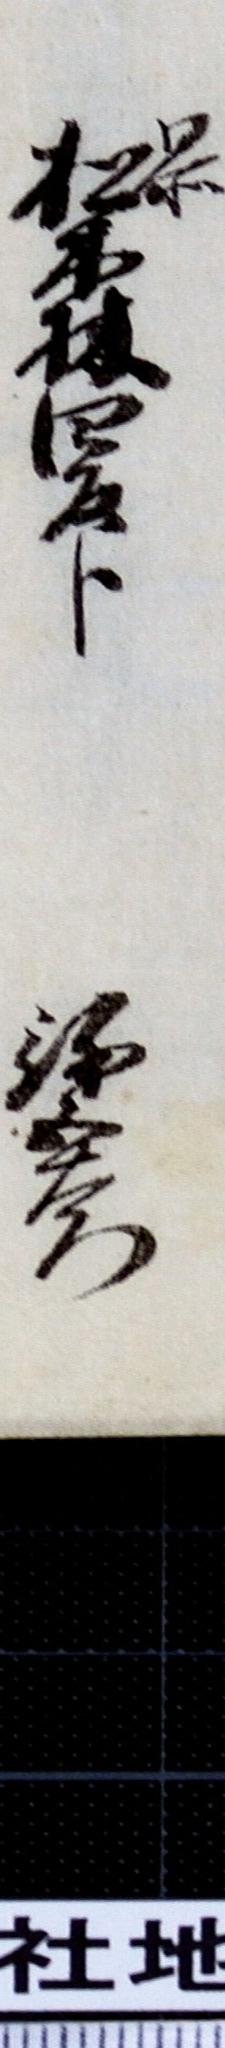松木林四反歩弥五右衛門
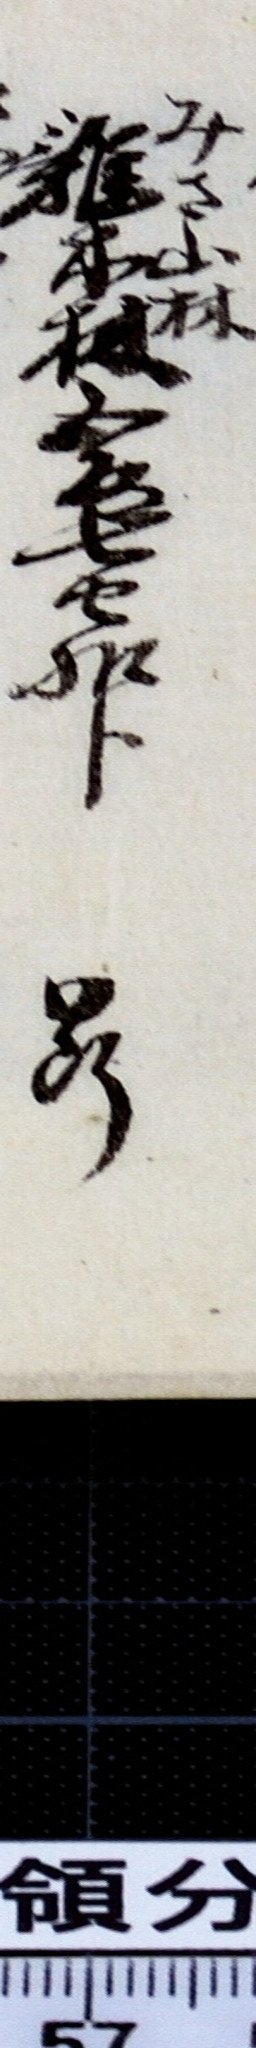雑木林五反七セ拾歩同断
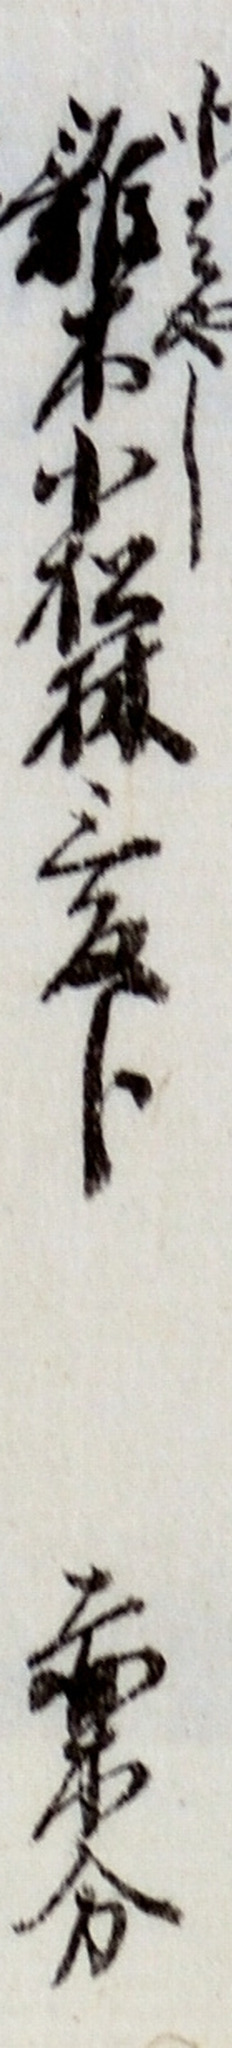雑木小松林三反歩赤木分
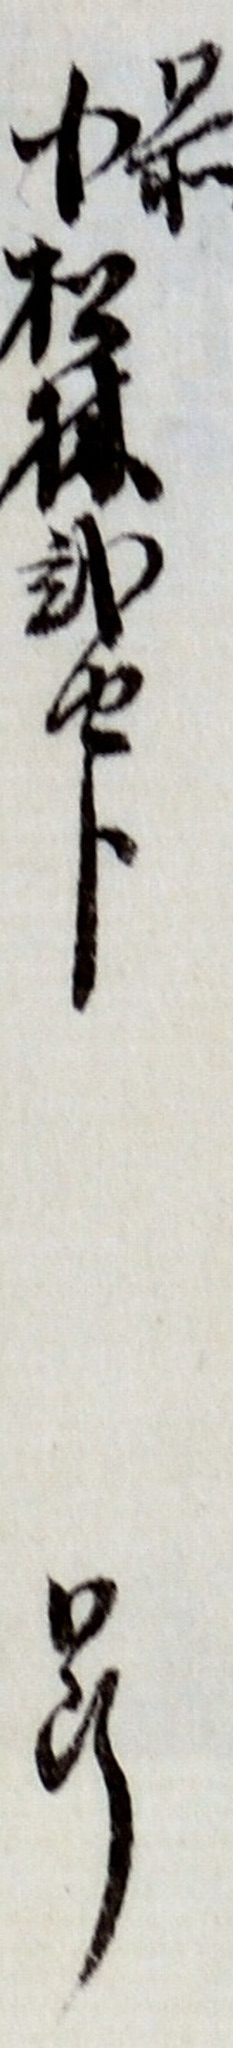小松林弐セ歩同断
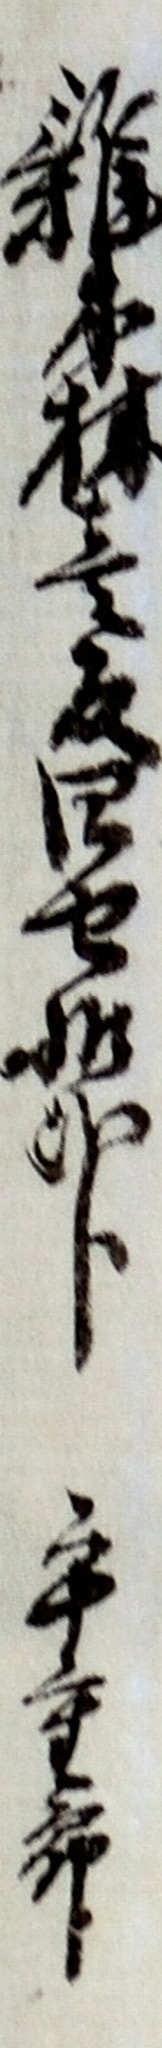雑木林壱反四セ拾弐歩平重郎
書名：御領分中山林社地手控
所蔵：伊那市立高遠町図書館・合同会社AMANE
